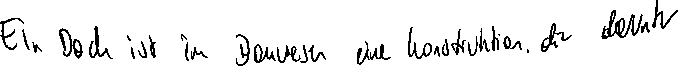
Ein Dach ist im Bauwesen eine Konstruktion, die darunter
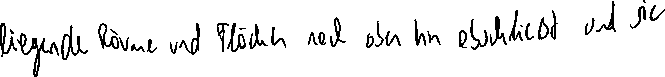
liegende Räume und Flächen nach oben hin abschließt und sie
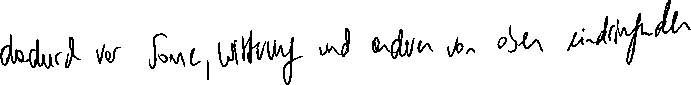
dadurch vor Sonne, Witterung und anderen von oben eindringenden
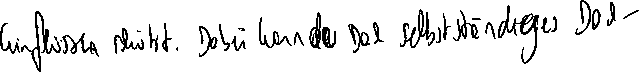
Einflüssen schützt. Dabei kann das Dach selbständiges Dach-
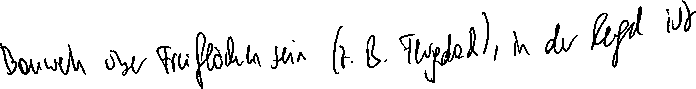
Bauwerk über Freiflächen sein (z. B. Flugdach), in der Regel ist
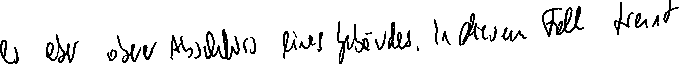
es aber oberer Abschluss eines Gebäudes. In diesem Fall trennt
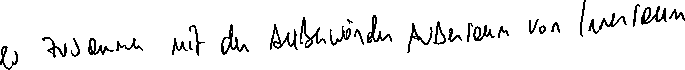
es zusammen mit den Außenwänden Außenraum von Innenraum
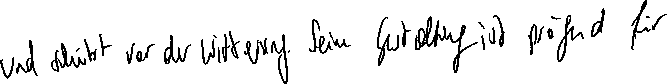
Und schützt vor der Witterung. Seine Gestaltung ist prägend für
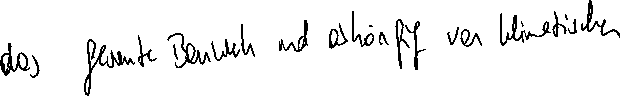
das gesamte Bauwerk und abhängig von klimatischen
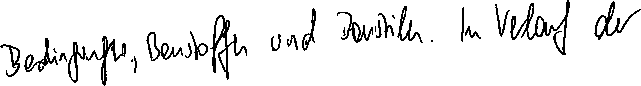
Bedingungen, Baustoffen und Baustilen. Im Verlauf der
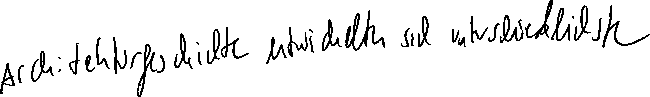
Architekturgeschichte entwickelten sich unterschiedlichste
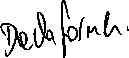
Dachformen.
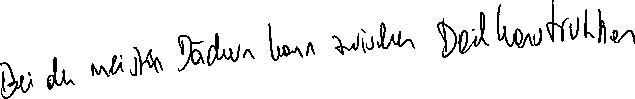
Bei den meisten Dächern kann zwischen Dachkonstruktion
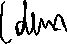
(dem
